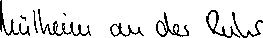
Mülheim an der Ruhr
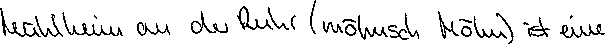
Mülheim an der Ruhr (mölmsch Mölm) ist eine
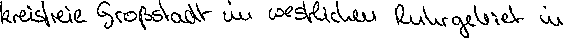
kreisfreie Großstadt im westlichen Ruhrgebiet in
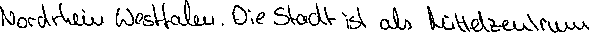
NordrheinWestfalen. Die Stadt ist als Mittelzentrum
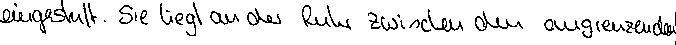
eingestuft. Sie liegt an der Ruhr zwischen den angrenzenden
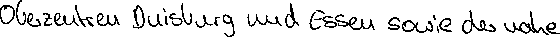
Oberzentren Duisburg und Essen sowie der nahe
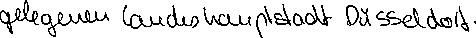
gelegenen Landeshauptstadt Düsseldorf.
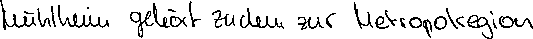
Mülheim gehört zudem zur Metropolregion
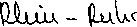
Rhein-Ruhr.
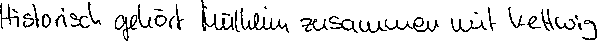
Historisch gehört Mülheim zusammen mit Kettwig
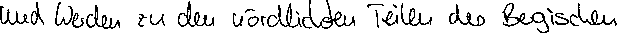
und Werden zu den nördlichsten Teilen des Bergischen
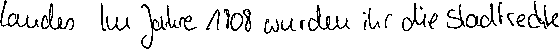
Landes. Im Jahre 1808 wurden ihr die Stadtrechte
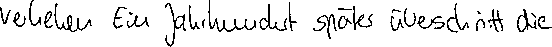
verliehen. Ein Jahrhundert später überschritt die
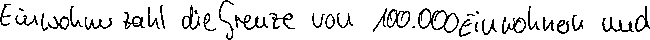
Einwohnerzahl die Grenze von 100.000 Einwohnern und
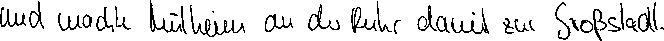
und machte Mülheim an der Ruhr damit zur Großstadt.
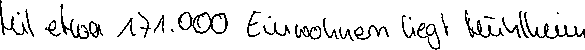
Mit etwa 171.000 Einwohnern liegt Mülheim
